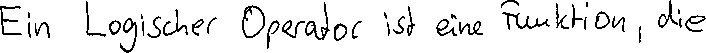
Ein Logischer Operator ist eine Funktion, die
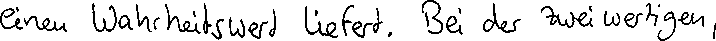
einen Wahrheitswert liefert. Bei der zweiwertigen,
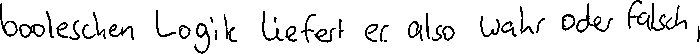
booleschen Logik liefert er also wahr oder falsch,
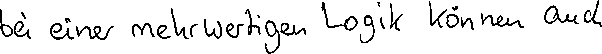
bei einer mehrwertigen Logik können auch
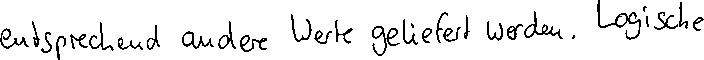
entsprechend andere Werte geliefert werden. Logische
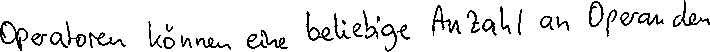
Operatoren können eine beliebige Anzahl an Operanden
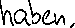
haben.
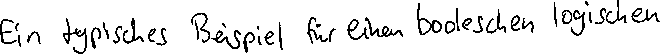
Ein typisches Beispiel für einen booleschen logischen
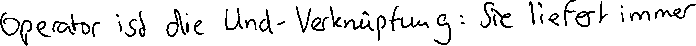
Operator ist die Und-Verknüpfung: Sie liefert immer
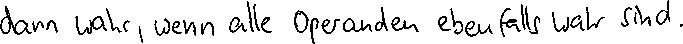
dann wahr, wenn alle Operanden ebenfalls wahr sind.
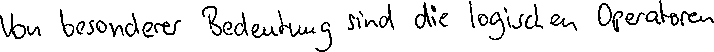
Von besonderer Bedeutung sind die logischen Operatoren
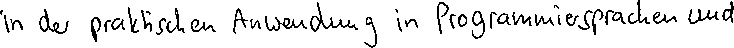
in der praktischen Anwendung in Programmiersprachen und
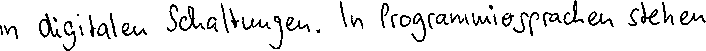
in digitalen Schaltungen. In Programmiersprachen stehen
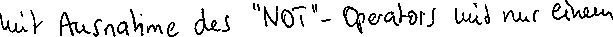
mit Ausnahme des "NOT"-Operators mit nur einem
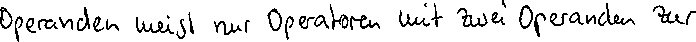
Operanden meist nur Operatoren mit zwei Operanden zur
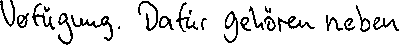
Verfügung. Dafür gehören neben
